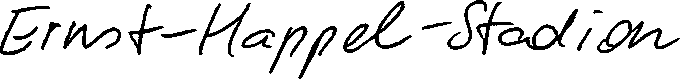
Ernst-Happel-Stadion
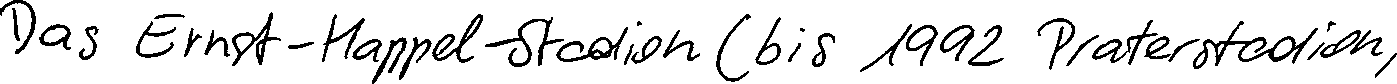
Das Ernst-Happel-Stadion (bis 1992 Praterstadion,
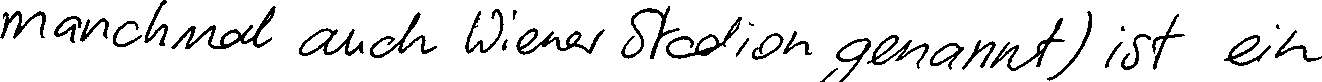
manchmal auch Wiener Stadion genannt) ist ein
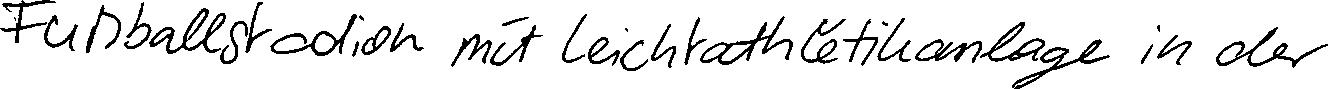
Fußballstadion mit Leichtathletikanlage in der
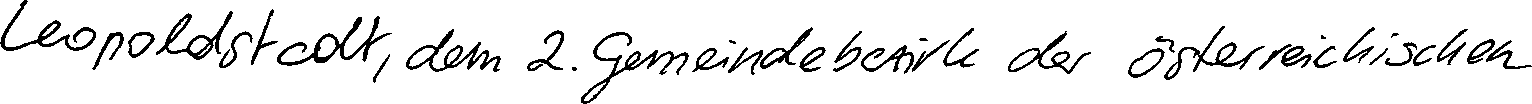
Leopoldstadt, dem 2. Gemeindebezirk der österreichischen
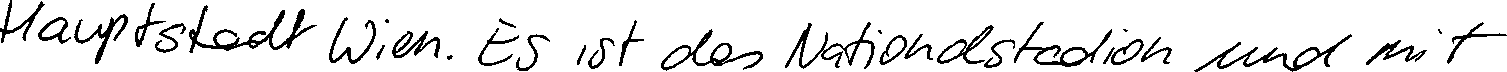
Hauptstadt Wien. Es ist das Nationalstadion und mit
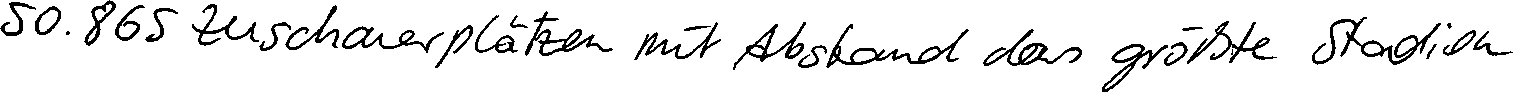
50.865 Zuschauerplätzen mit Abstand das größte Stadion
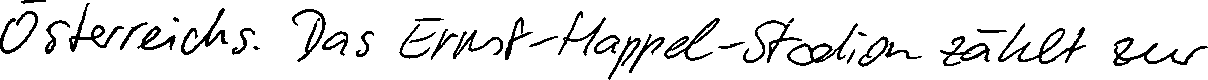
Österreichs. Das Ernst-Happel-Stadion zählt zur
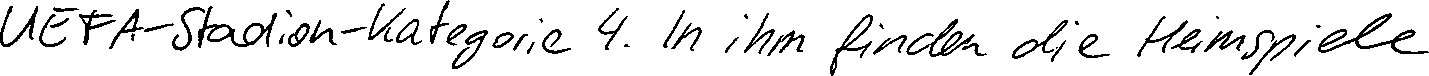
UEFA-Stadion-Kategorie 4. In ihm finden die Heimspiele
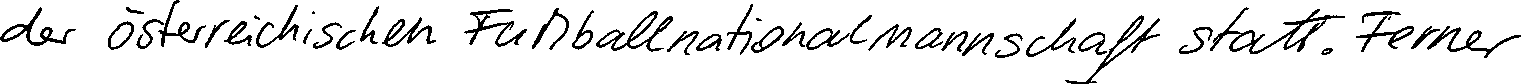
der österreichischen Fußballnationalmannschaft statt. Ferner
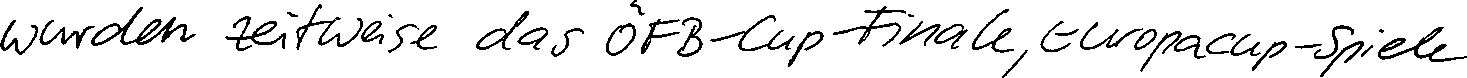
wurden zeitweise das ÖFB-Cup-Finale, Europacup-Spiele
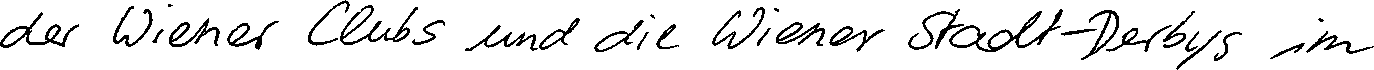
der Wiener Clubs und die Wiener Stadt-Derbys im
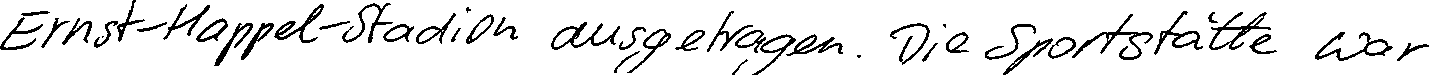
Ernst-Happel-Stadion ausgetragen. Die Sportstätte war
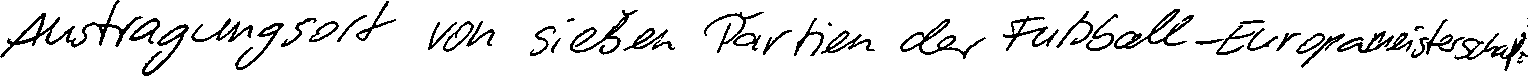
Austragungsort von sieben Partien der Fußball-Europameisterschaft
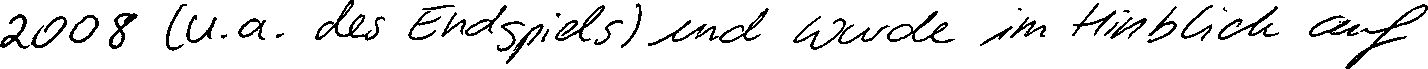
2008 (u. a. des Endspiels) und wurde im Hinblick auf
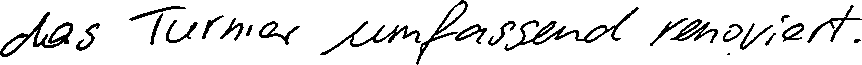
das Turnier umfassend renoviert.
